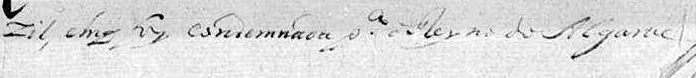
zil em q̄ foy condemnada p.a o Reyno do Algarue
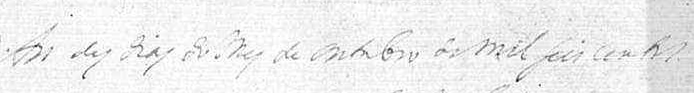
Aos des dias do Mes de Outubro de mil seiscentos
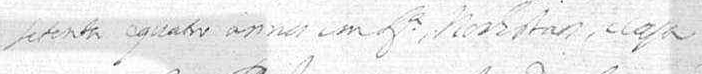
setenta e quatro annos em Lx.a, nos estaos e casa
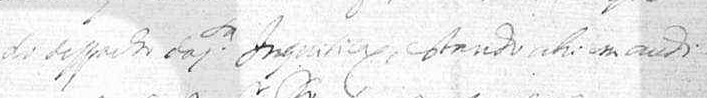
do despacho da s.ta Inquisiçaꝭ, estando ahi em audi
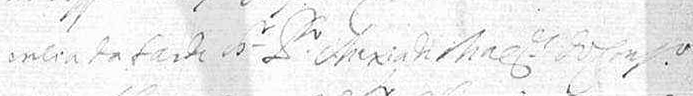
encia da tarde Fr P.o Mexia de Mag.es do Cons.o
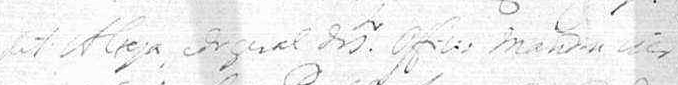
de S Alteza, e do geral do s.to Officio mandou uir
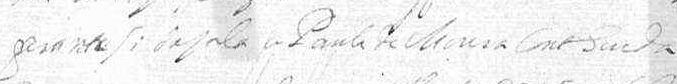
perante si da sala a Paula de Moura Contheuda
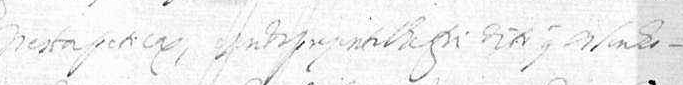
nesta petiçaꝭ, e sendo presente lhe foi dito q̄ os senho
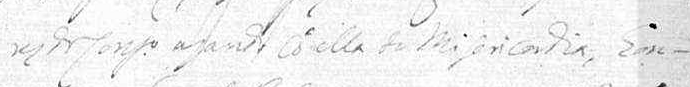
res do Cons.o usando cō ella de Misericordia, hou
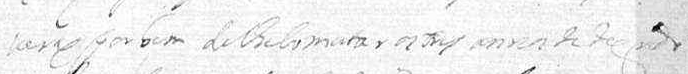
ueraõ por bem de Recomutar os tres annos de degredo
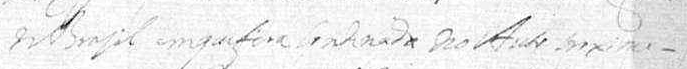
de Brazil em que fora condenada no Auto proximo
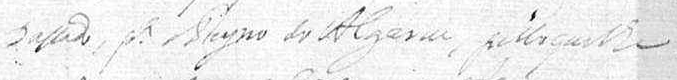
passado, p.a o Reyno do Algarue, pello que lhe
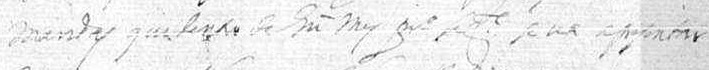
mandaꝭ que dentro de hū mes pr.o segte se ua apresentar
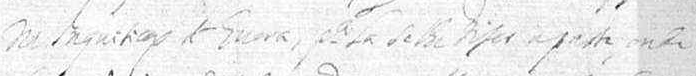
na Inquisiçaꝭ d̄ Euora, pa la se lhe diser a parte, onde
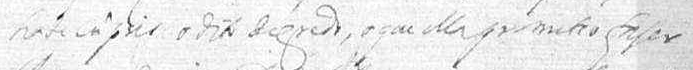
hade cūprir o dito degredo, o que ella prometeo faser
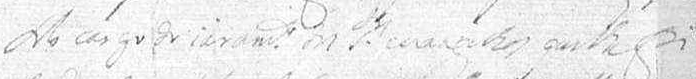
sob cargo do iuram.to dos s.tos euangelhos que lhe foi
